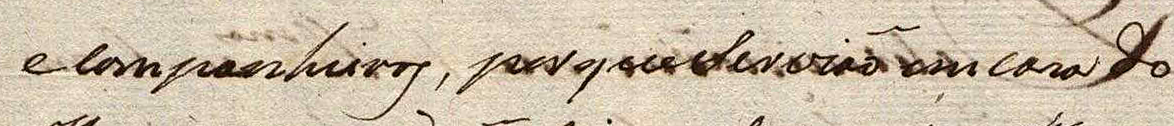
e companheiros, porque serviaõ em caza do
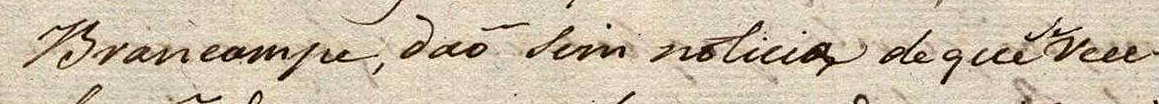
Brancampe, daõ sim noticia de que se rece
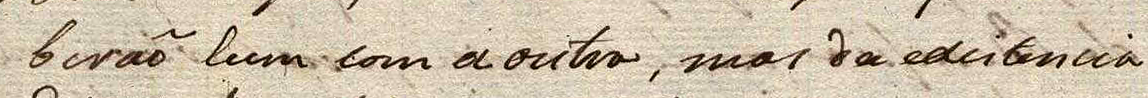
beraõ hum com a outra, mas da existencia
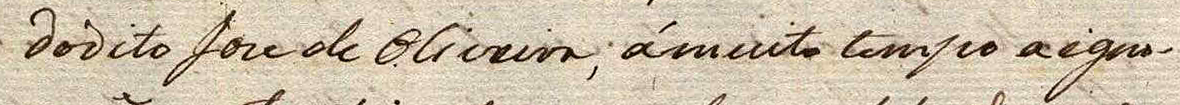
do dito Joze de Oliveira, á muito tempo a igno
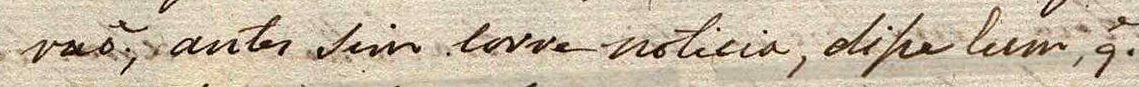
raõ, antes sim corre noticia, disse hum, q̄
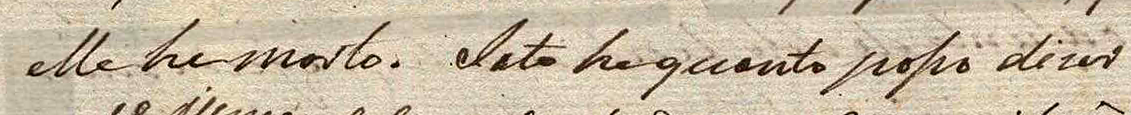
elle he morto. Isto he quanto posso dizer
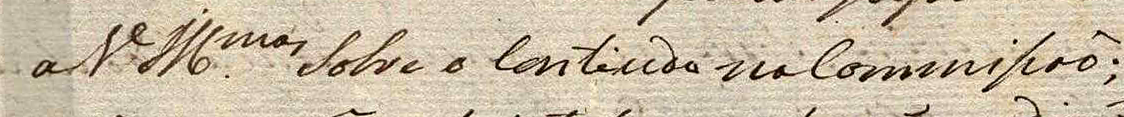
a V Ill.mas sobre o contiudo na Commissaõ;
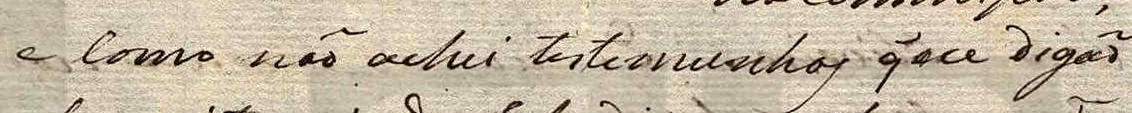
e como naõ achei testemunhas q̄ue digaõ
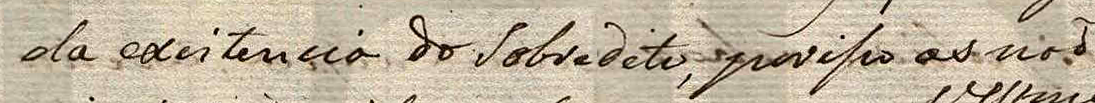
da existencia do sobredito, por isso as naõ
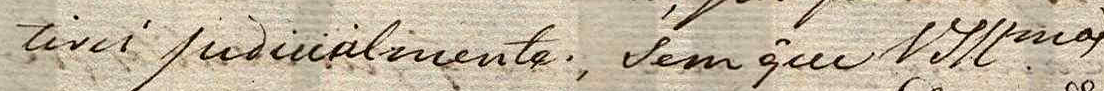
tirei judicialmente; sem que V Ill.mas
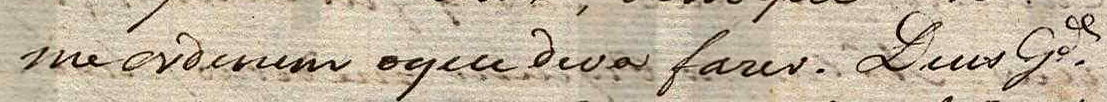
me ordenem o que deva fazer. Deus G.de
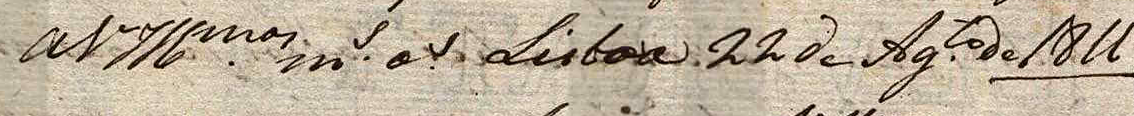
a V Ill.mas m.s a.s Lisboa 22 de Ag.to de 1811
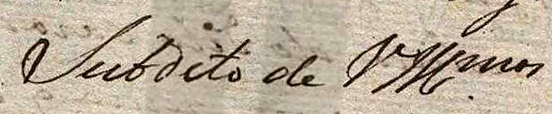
Subdito de V Ill.mas
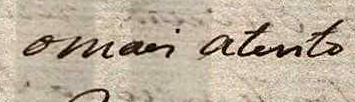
o mais atento
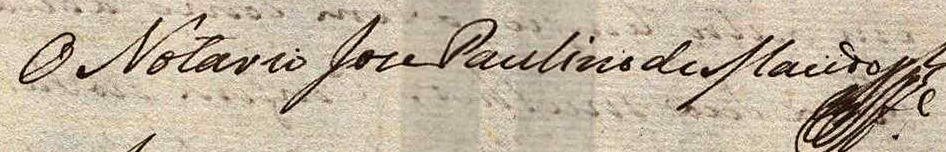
O Notario Joze Paulino de Macedo
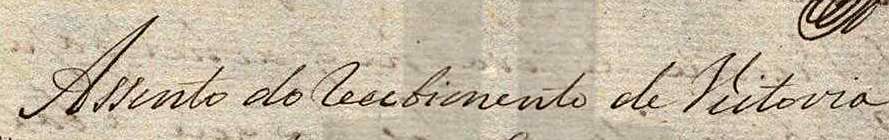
Assento do Recebimento de Victoria
